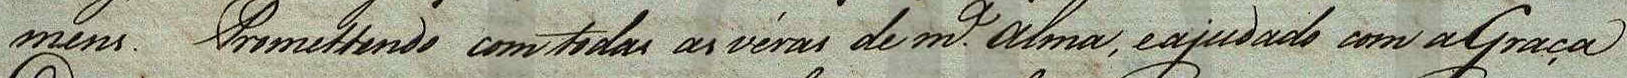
mens. Promettendo com todas as véras de m.a alma, e ajudado com a Graça
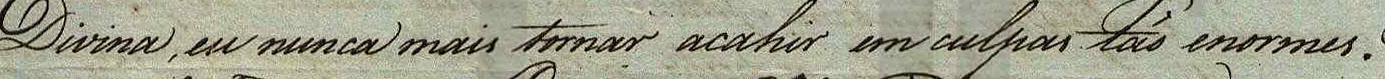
Divina, eu nunca mais tornar a cahir em culpas taõ enormes.
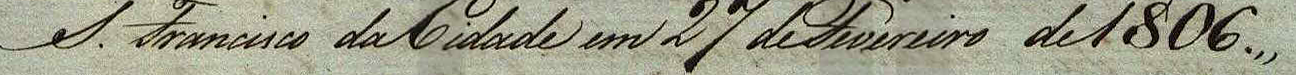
S. Francisco da Cidade em 27 de Fevereiro de 1806.
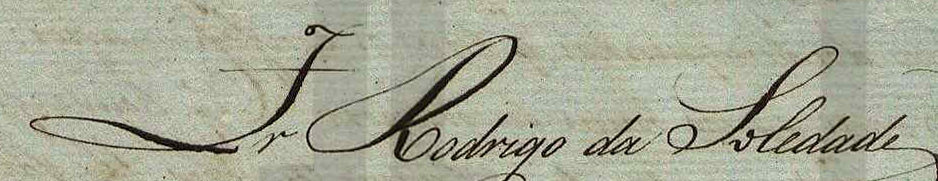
Fr Rodrigo da Soledade
